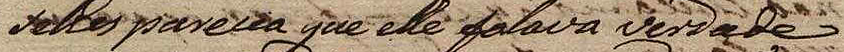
se lhes parecia que elle falava verdade
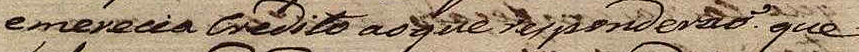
e merecia credito ao que responderaõ que
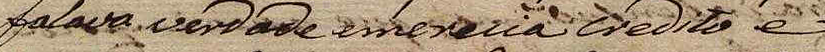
falava verdade e merecia credito e
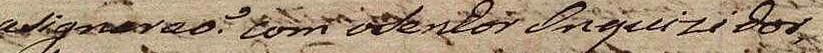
asignaraõ com o Senhor Inquizidor,
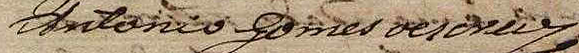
Antonio Gomes o escrevj
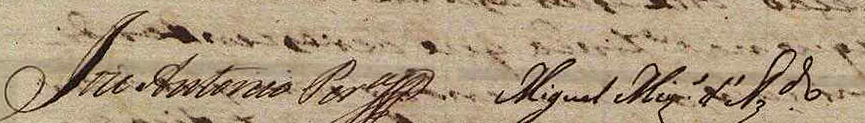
Joze Antonio Per.a Miguel Miz̄ d'Az.do
